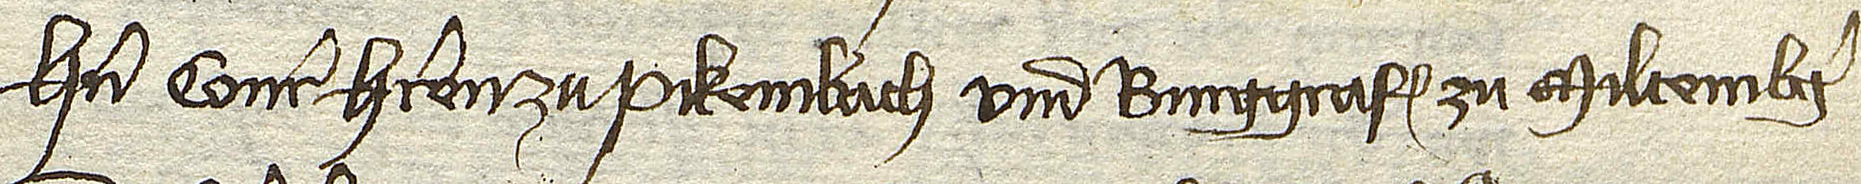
H*n Conr* h*ren ʒu Pikembach vnd Burggraf* ʒu Miltemb*g
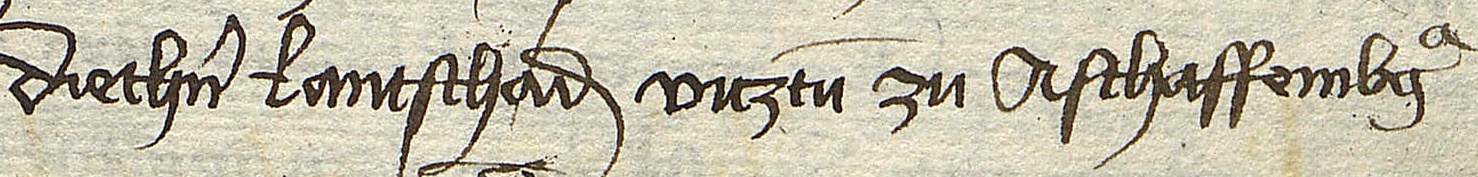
Dieth*n lantſchad* vicʒtu* ʒu Aſchaffemb*g
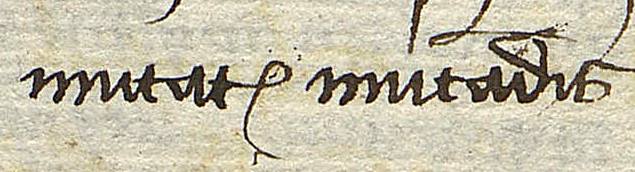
mutat* muta*dis
